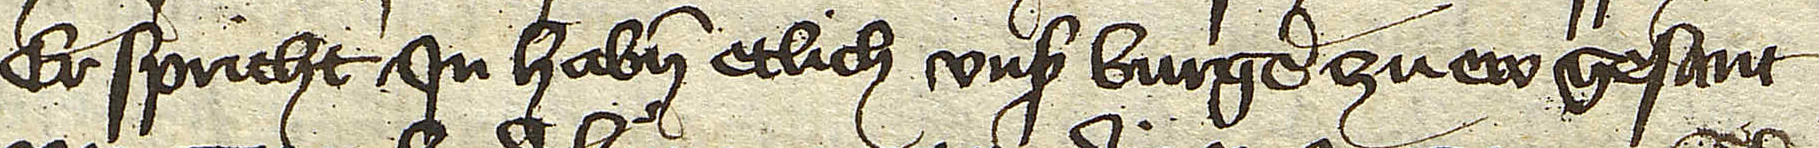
Er ſpricht / In habn* etlich vnſ* burge* cʒu ew geſant
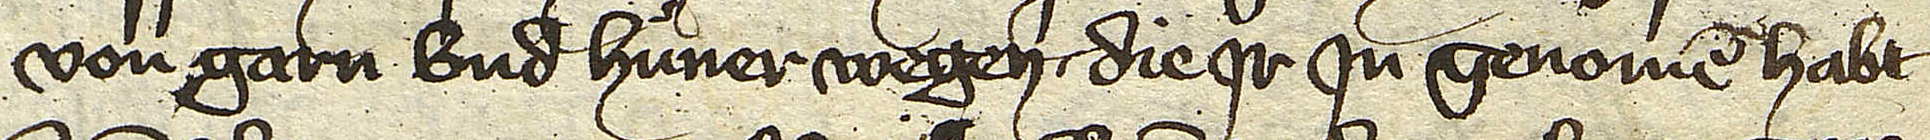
von garn vnd hüner wegen / die Ir In genome* habt
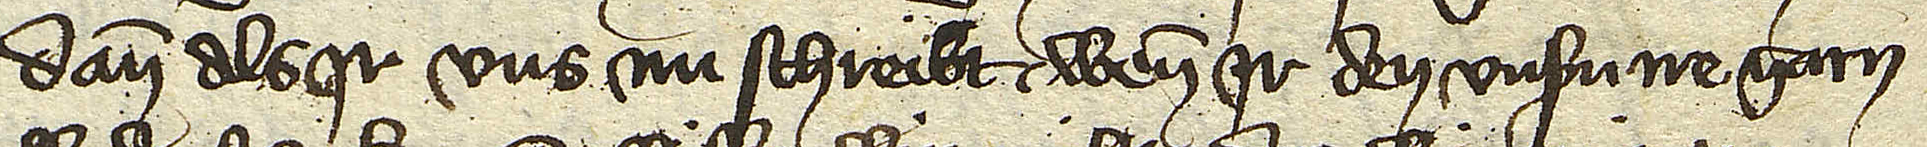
dan* als Ir vns nu ſchreibt / wen* Ir den vnſ*n ire garn
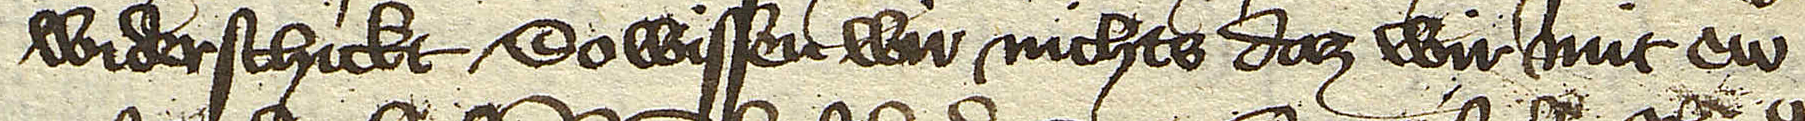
widerſchickt / So wiſſen wir nichts daʒ wir mit ew
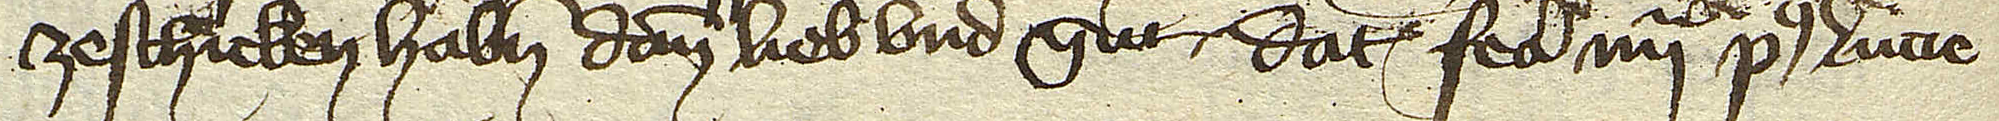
cʒeſchicken habn* dan* lieb vnd gut / dat* fea* iiii* p* Lucie
